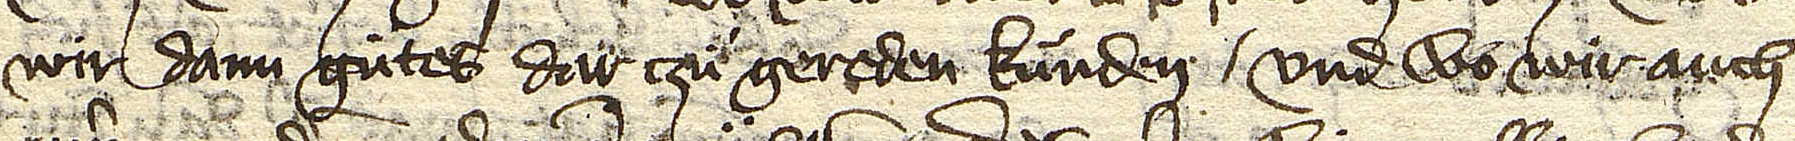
wir dann gütes dar cʒü gereden künden / vnd wo wir auch
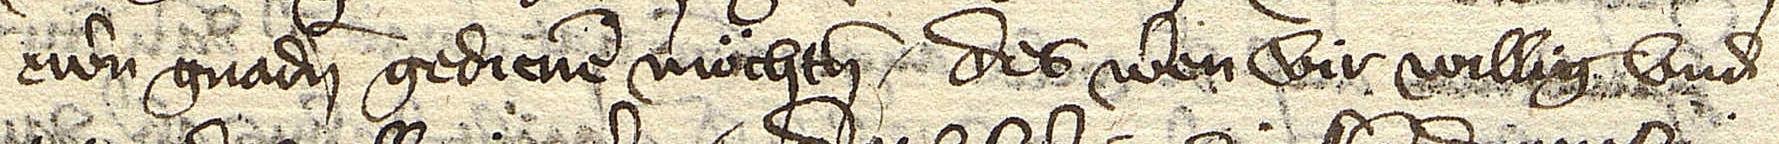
ewn* gnadn* gediene* möchtn* / Des w*en wir willig vnd
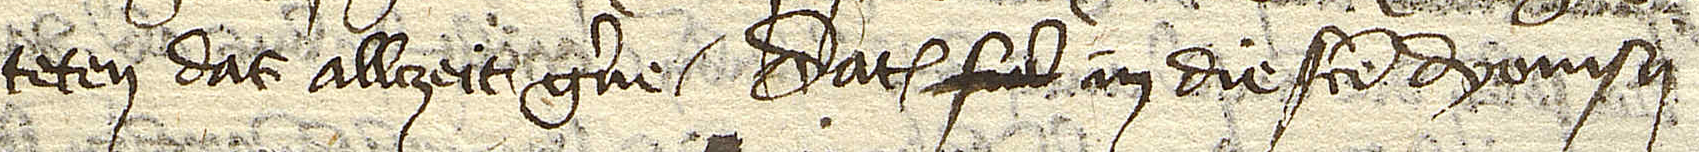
teten das allcʒeit g*ne / Dat* fia* in die ſci* dyoniſii*
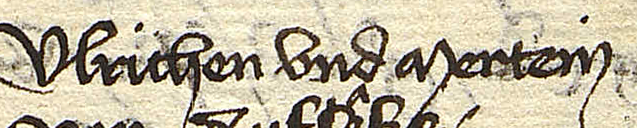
Vlrichen vnd Mertein
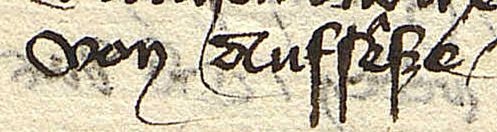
von Aufſëſ*e /
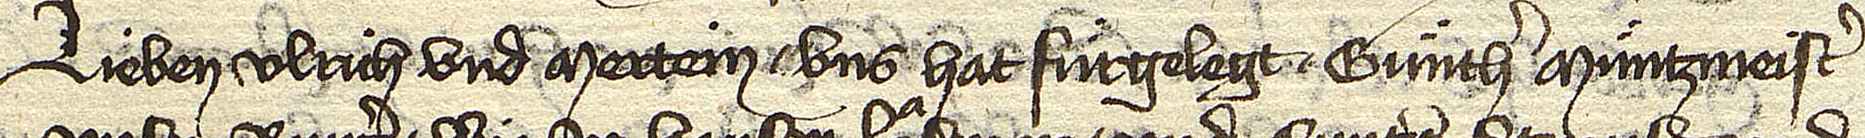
Lieben vlrich vnd Mertein / vns hat fürgelegt / Günth* Müntʒmeiſt*
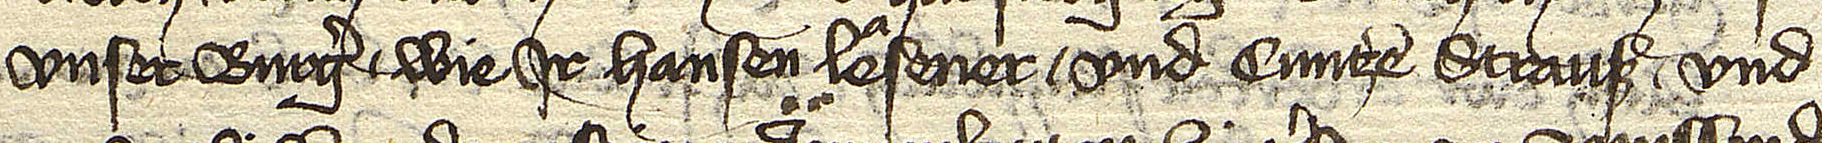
vnſer Burg* / Wie Ir hanſen lëſener / vnd Cuntʒe* Strauſʒ / vnd
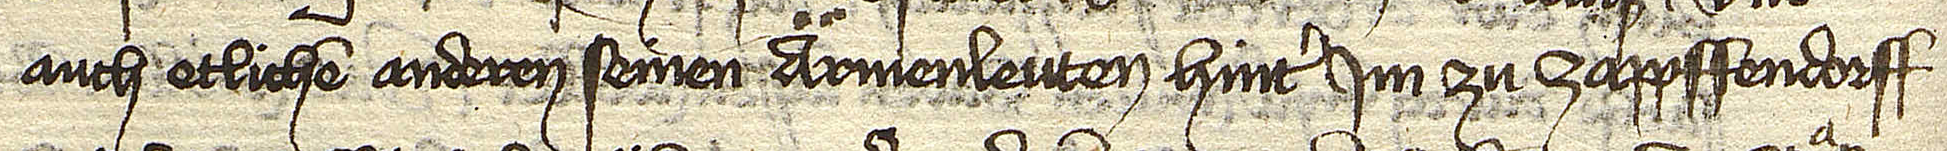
auch etliche* anderen ſeinen Armenleuten hint* Im cʒu Ʒappffendorff
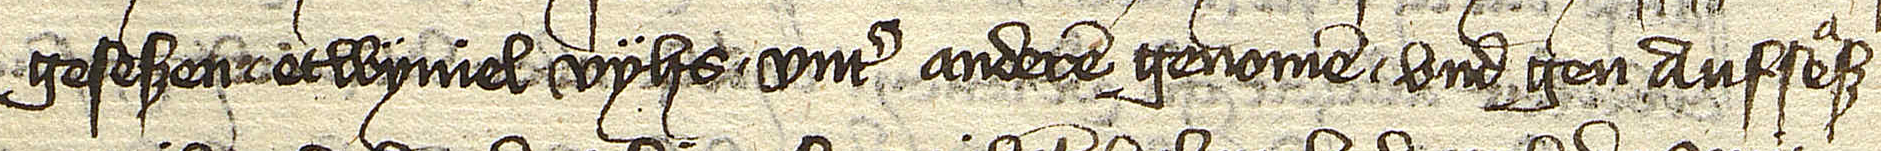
geſeſʒen etwyuiel vyhs / vnt* andere* genome* / vnd gen Aufſëſʒ
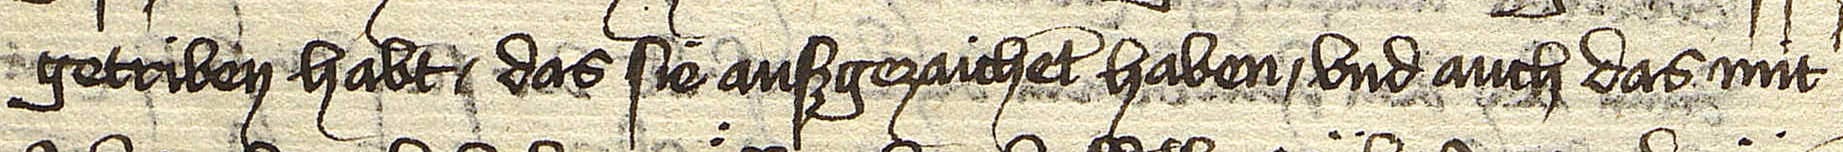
getriben habt / das ſie auſʒgeʒaichet* haben / vnd auch das mit
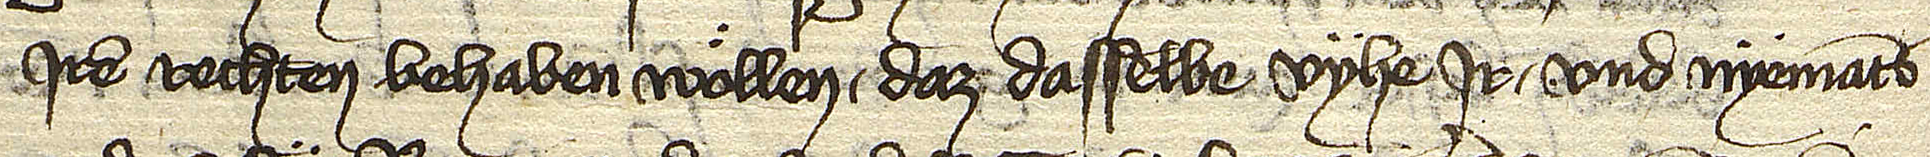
Ire* rechten behaben wöllen / daʒ daſſelbe vyhe Ir / vnd nyemats*
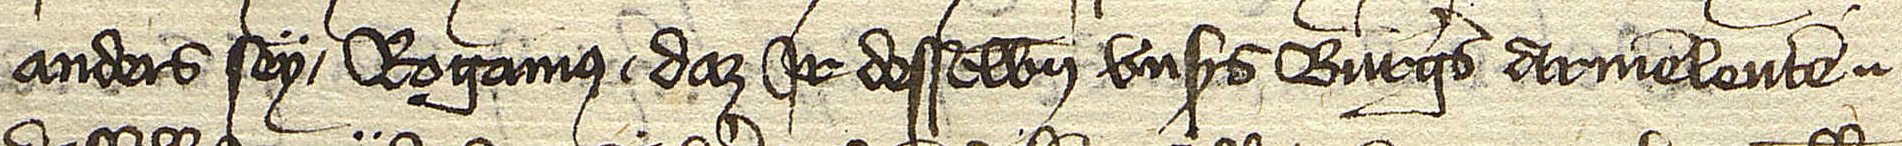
anders ſey / Rogam* / daʒ Ir deſſelbn* vnſ*s Burgs* Arme*leute* ~
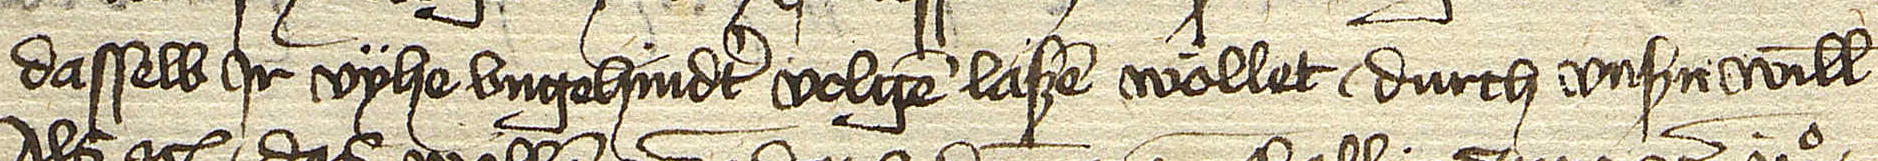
daſſelb Ir vyhe vngehindt* volge* laſʒe* wöllet / durch vnſn* will*
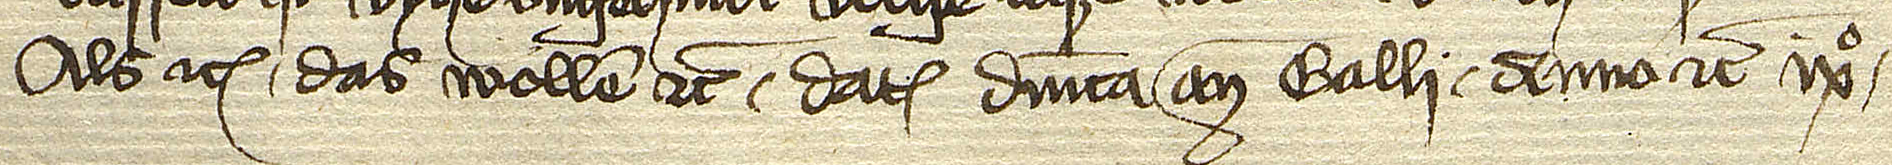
Als ec* / das wolle* ec* / dat* dnica* an* Galli / Anno ec* ix* /
